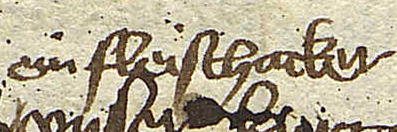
ein fleiſchacker
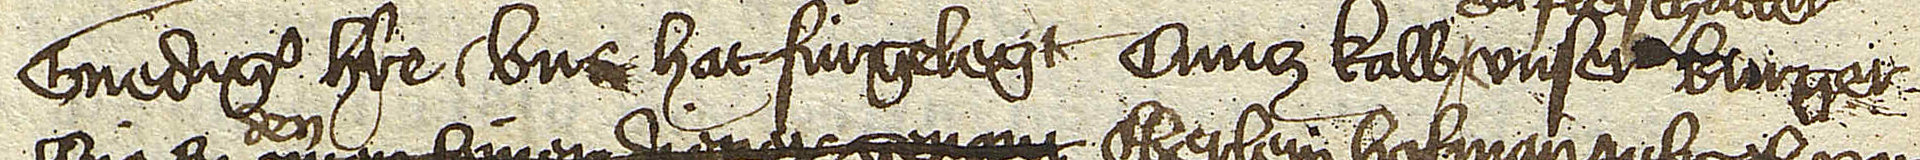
Gnedig* h*re / vns hat fürgelegt Cuncʒ Kalb vnſer burger
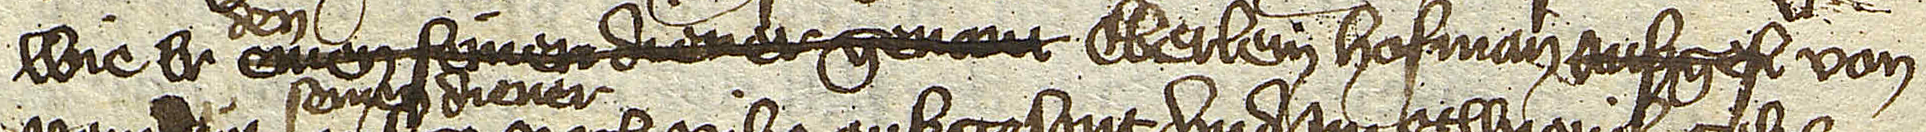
wie Er einen ſeiner diener genant Eberlein hofman auſʒgeſc von
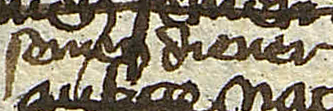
ſeiner diener
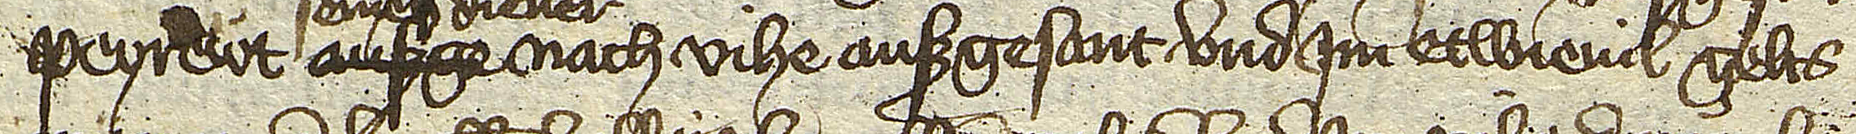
Peyrewt auſʒge nach vihe auſʒgeſant vnd Im etwieuil gelts
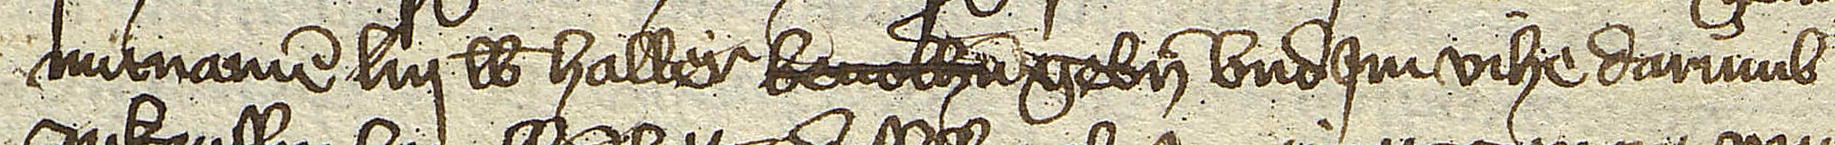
mitname liii lb* haller beuohln* gebn* vnd Im vihe darümb
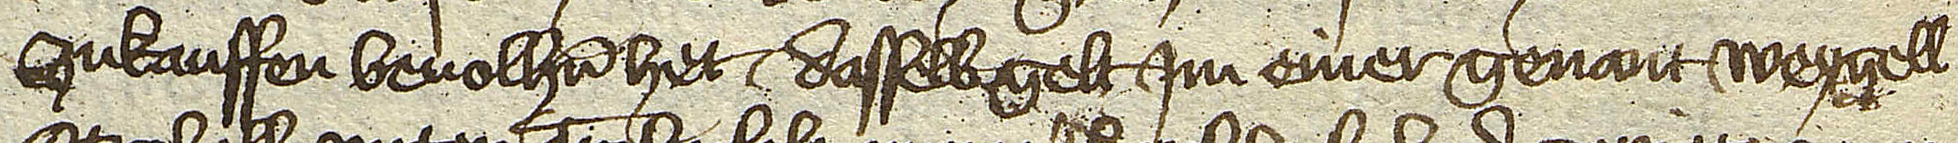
cʒukauffen beuolhn* het / daſſelb gelt Im einer genant weygell
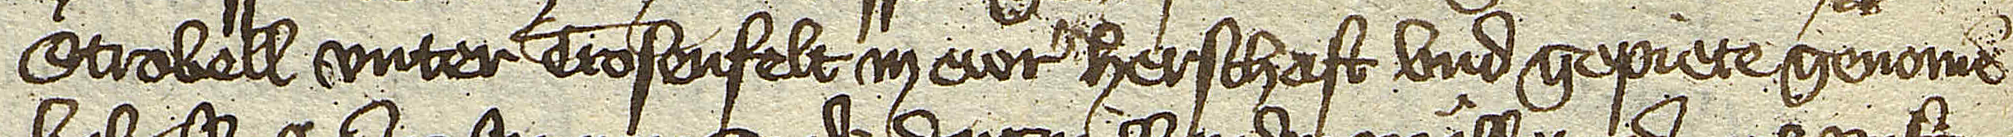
Strobell vnter Troſenfelt in ewr* herſchaft vnd gepiete genome*
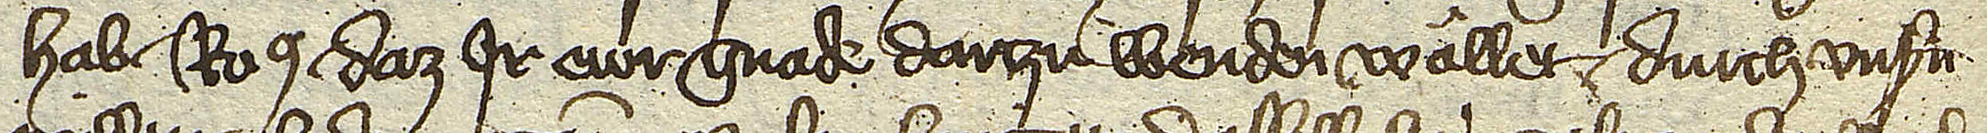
hab / Ro* / daʒ Ir ewr gnade darcʒu wenden wöllet / durch vnſ*n
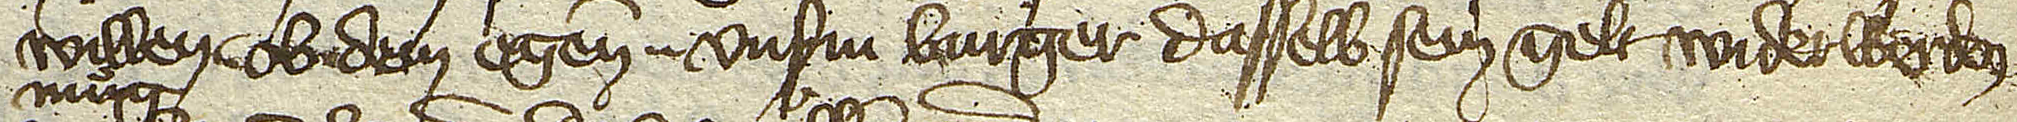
willen / ob dem egen* ~ vnſ*m burger daſſelb ſein gelt wider werden
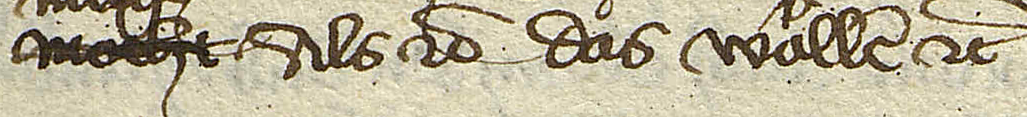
mocht / Als ec* das wölle* ec*
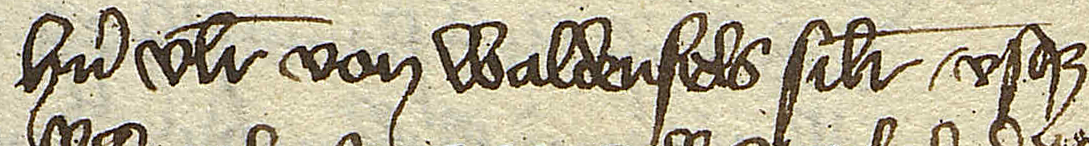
hn* vlr* von waldenfels ſilr* / vſq*
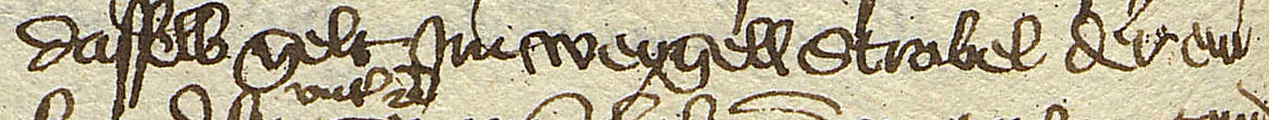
daſſelb gelt Im wegell Strobel der ew*
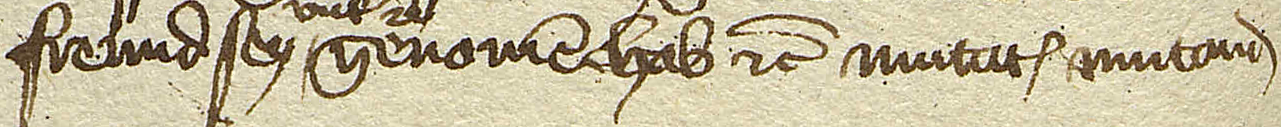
freund ſey genome* hab ec* mutat* mutand
